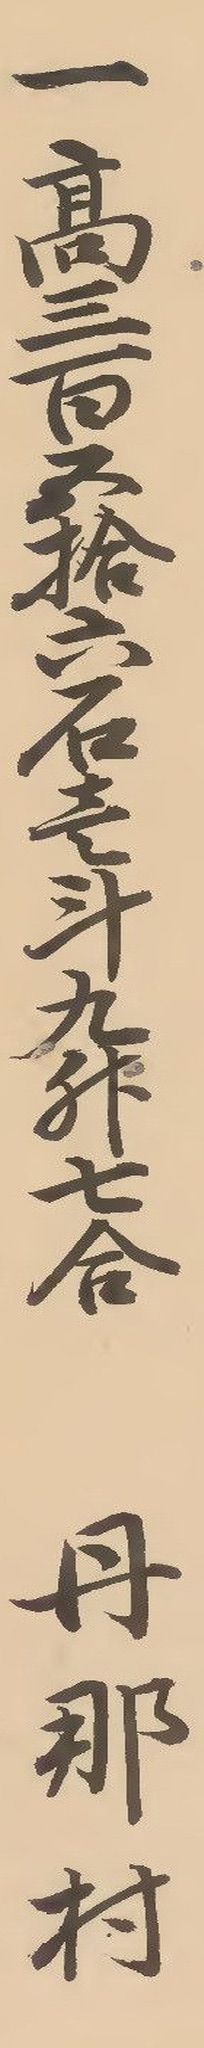一高三百五拾六石壱斗九升七合丹那村

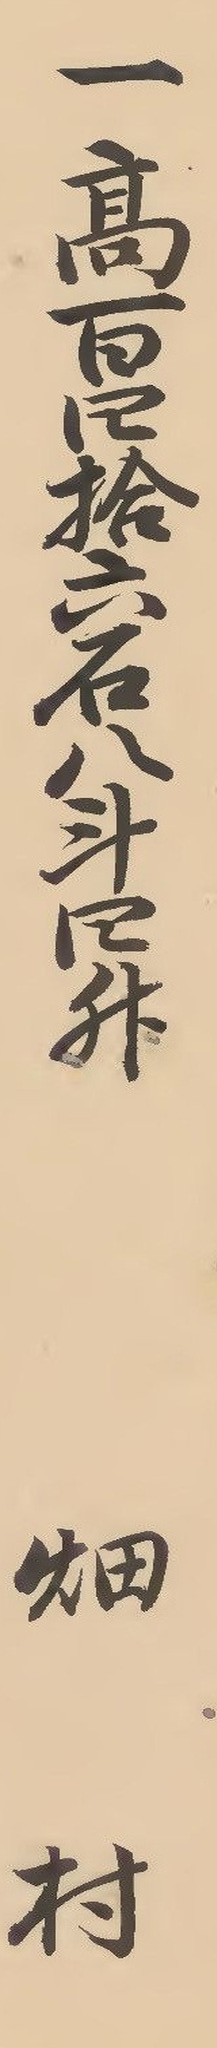一高百四拾六石八斗四升畑村
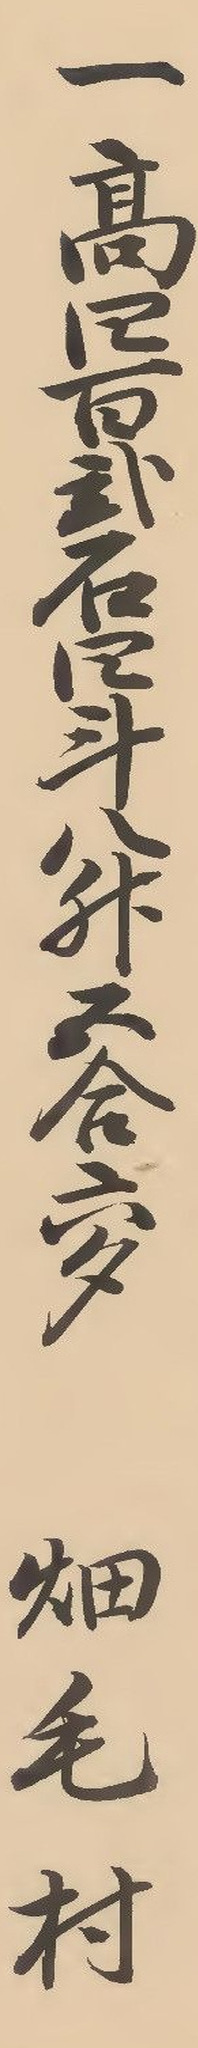一高四百弐石四斗八升五合六勺畑毛村
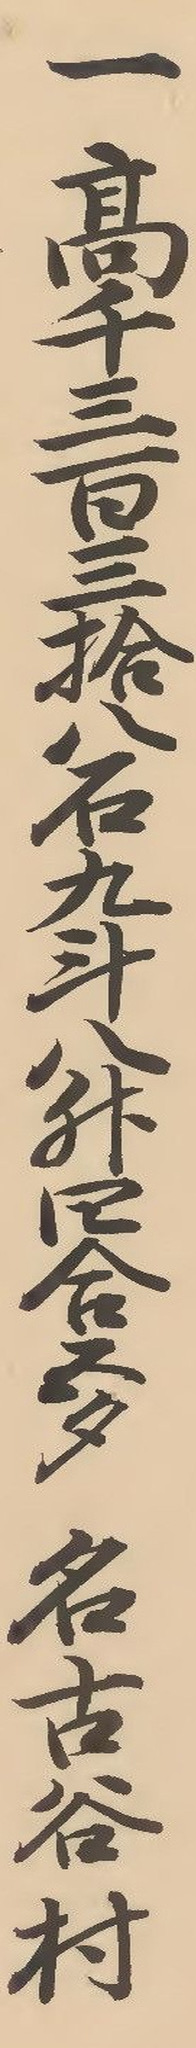一高千三百三拾八石九斗八升四合五勺名古谷村
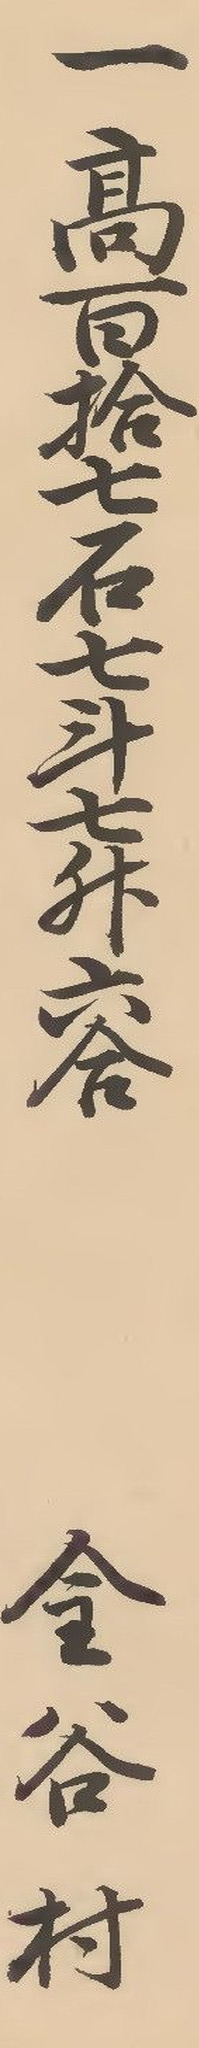一高百拾七石七斗七升六合金谷村
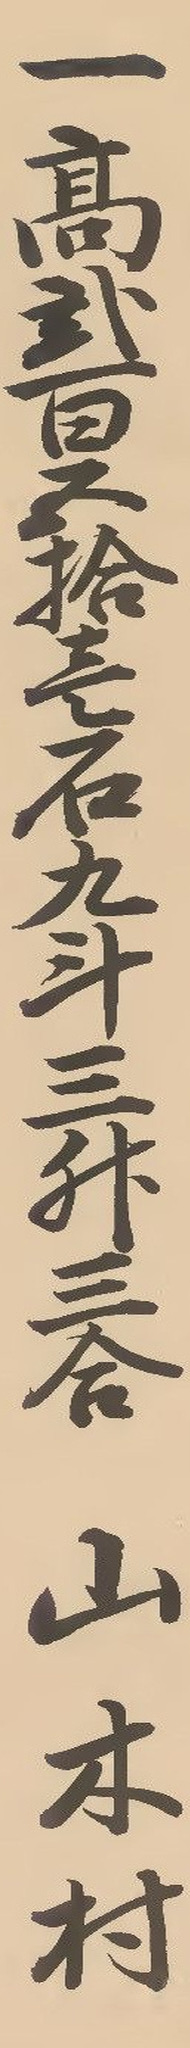一高弐百五拾壱石九斗三升三合山木村
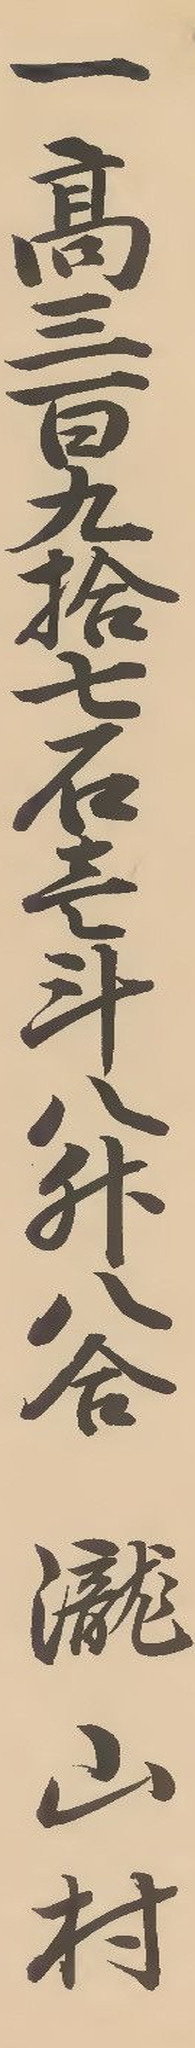一高三百九拾七石壱斗八升八合滝山村
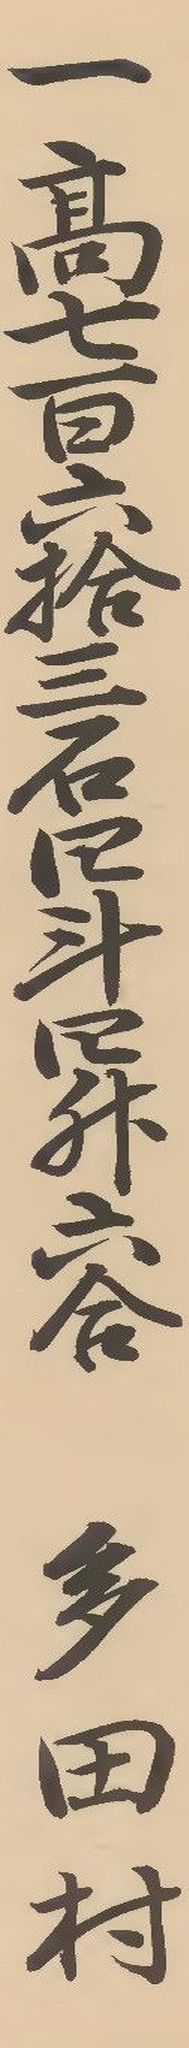一高七百六拾三石四斗四升六合多田村

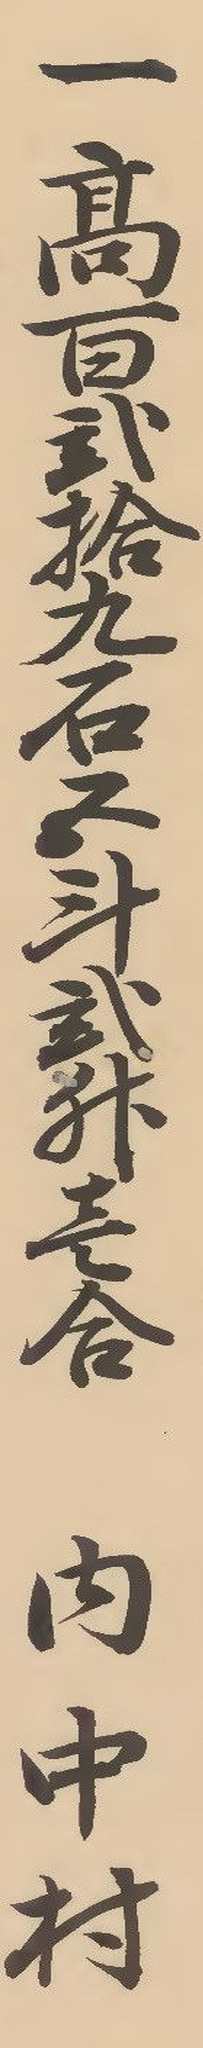一高百弐拾九石五斗弐升壱合内中村
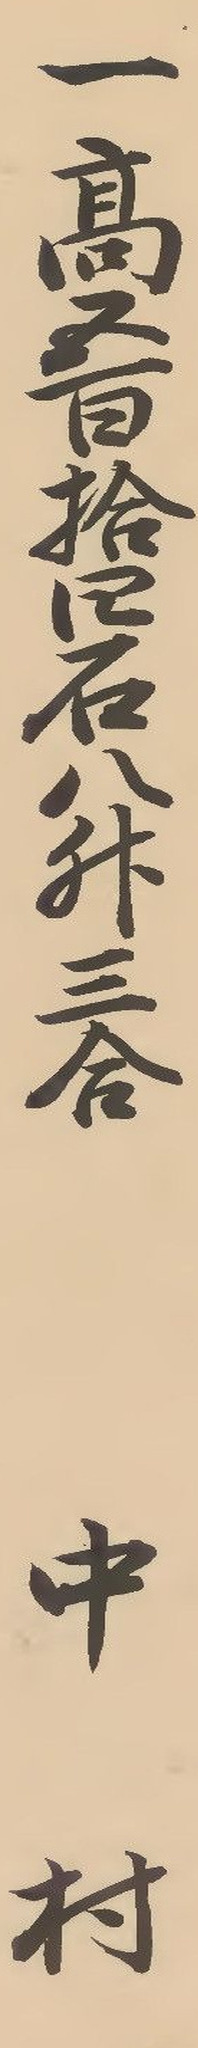一高五百拾四石八斗三合中村
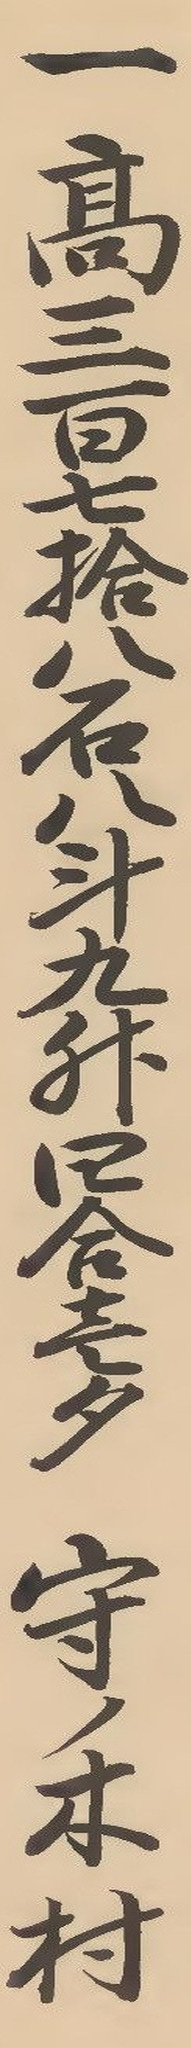一高三百七拾八石八斗九勺四合壱勺守ノ木村
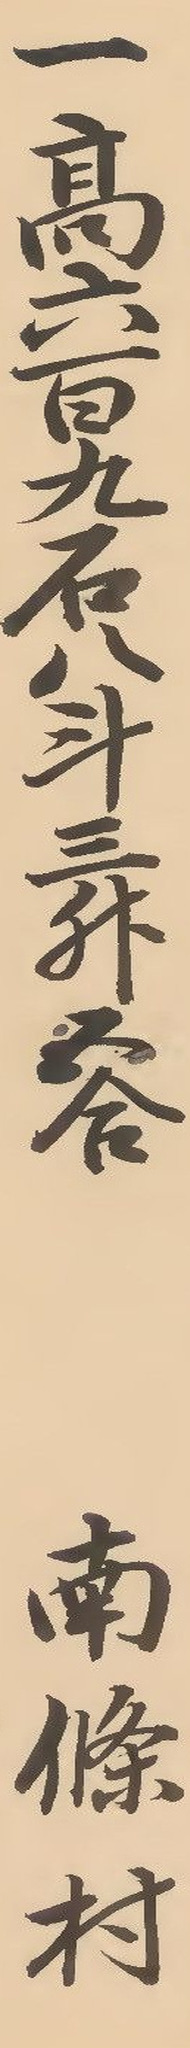一高六百九石八斗三升五合南条村

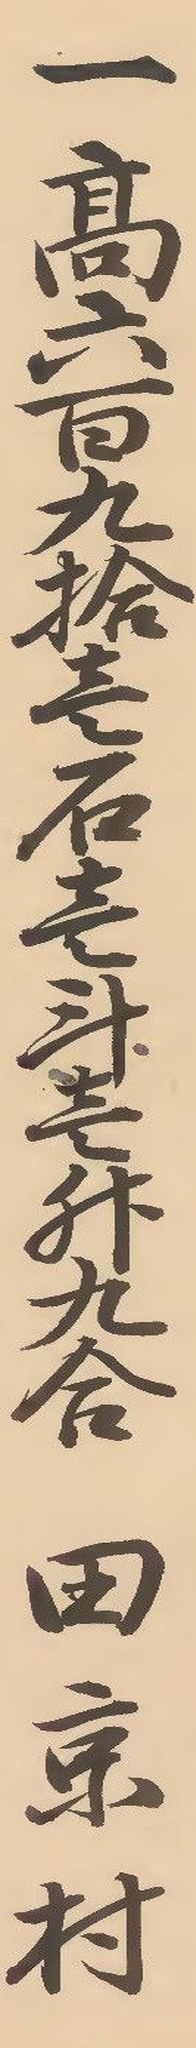一高六百九拾壱石壱斗壱升九合田京村
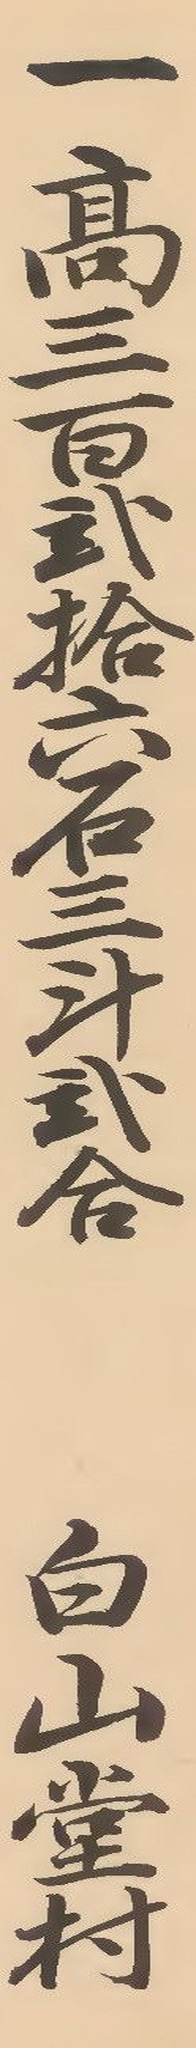一高三百弐拾六石三斗弐合白山堂村
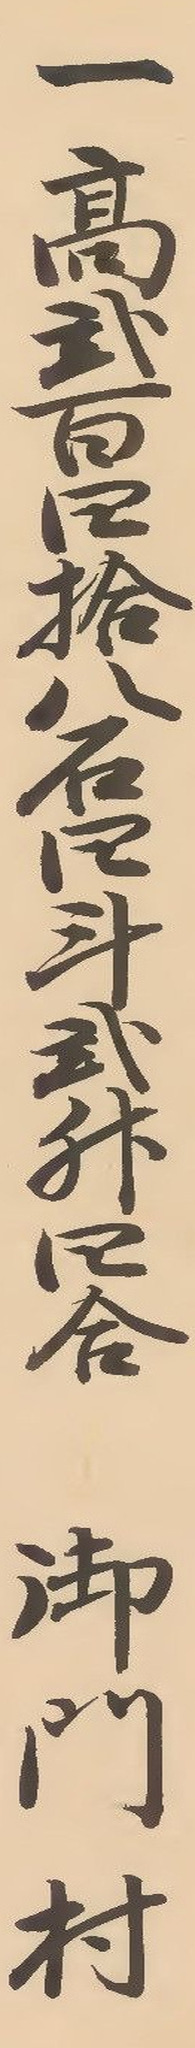一高弐百四拾八石四斗弐升四合御門村
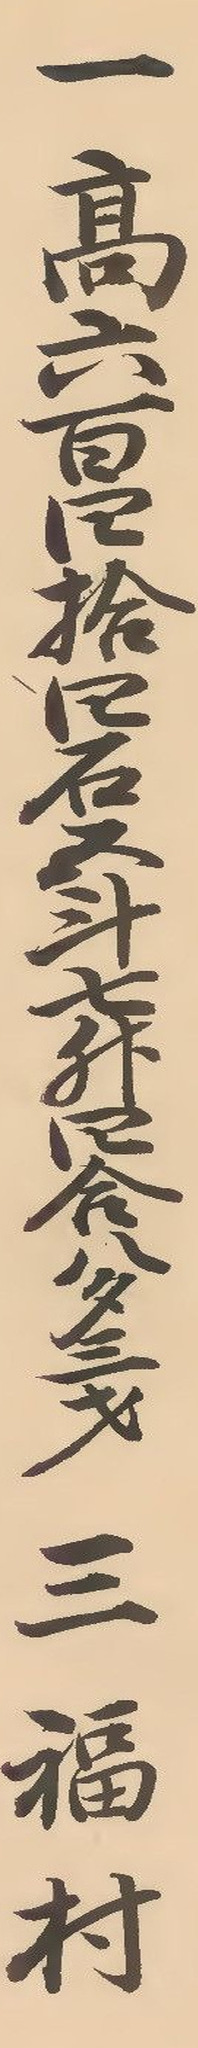一高六百四拾四石五斗七升四合八勺三才三福村
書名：伊豆国郷帳
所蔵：国立公文書館 National Archives of Japan
